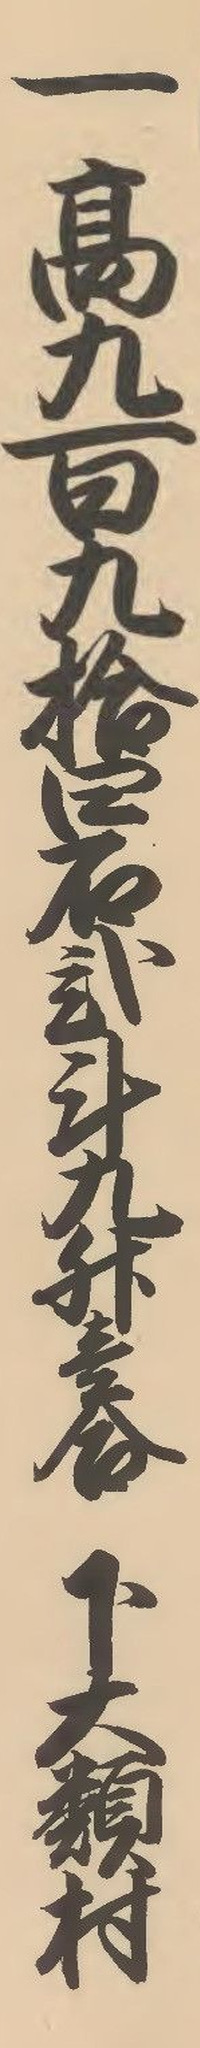一髙九百九拾四石弐斗九升壱合下大類村
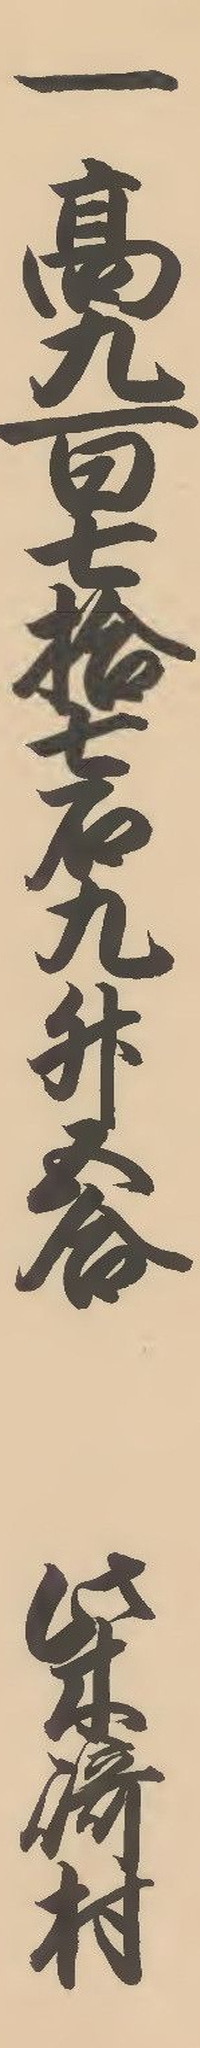一髙九百七拾七石九升五合柴崎村
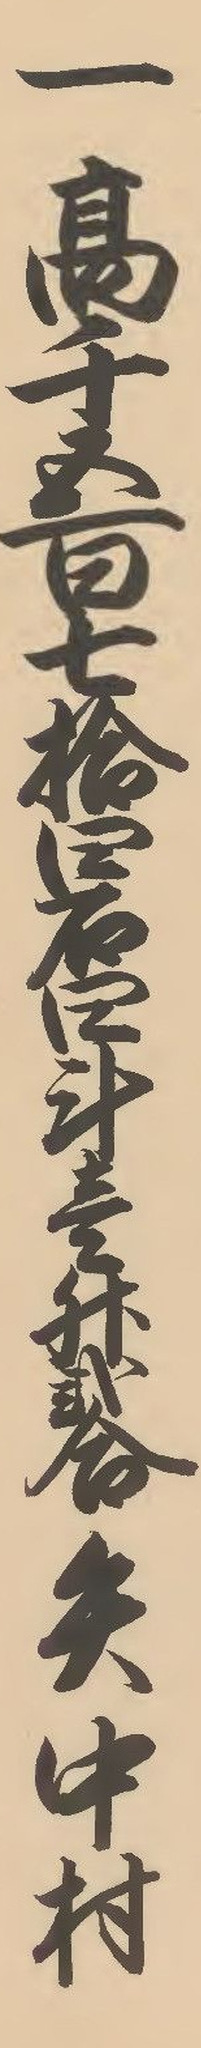一髙千五百七拾四石四斗壱升弐合矢中村

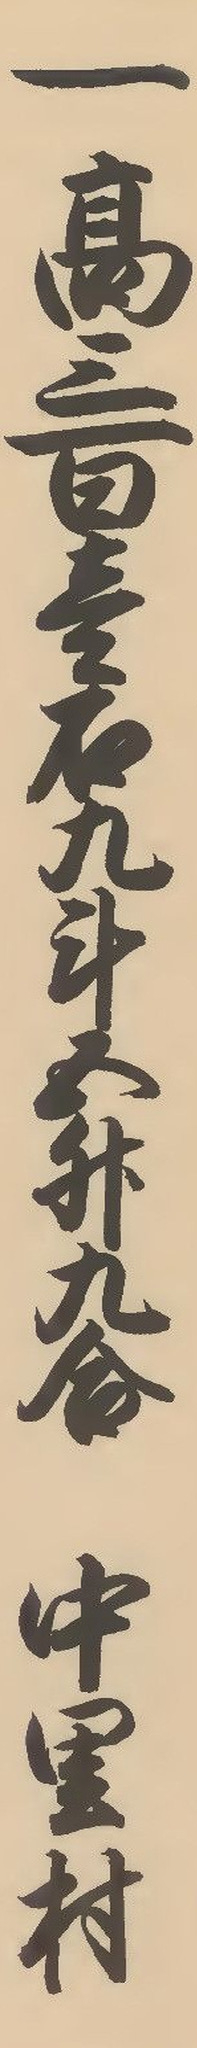一髙三百壱石九斗五升九合中里村
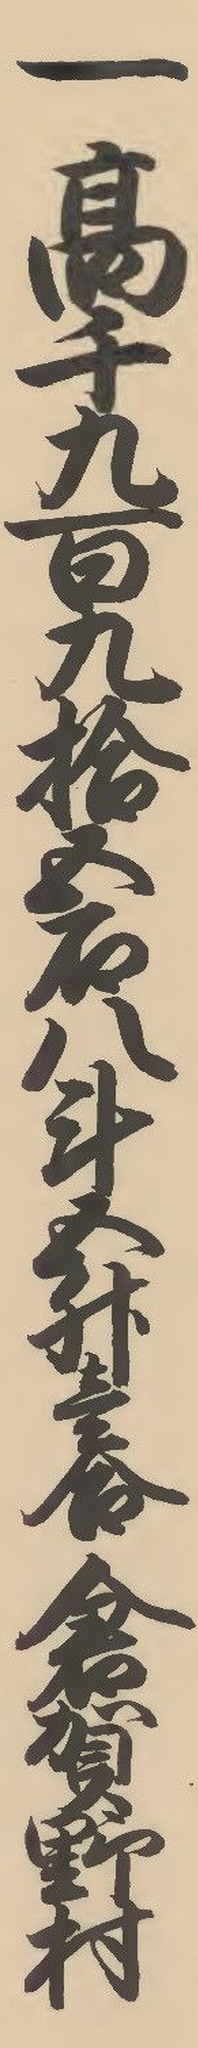一髙千九百九拾五石八斗五升壱合倉賀野村
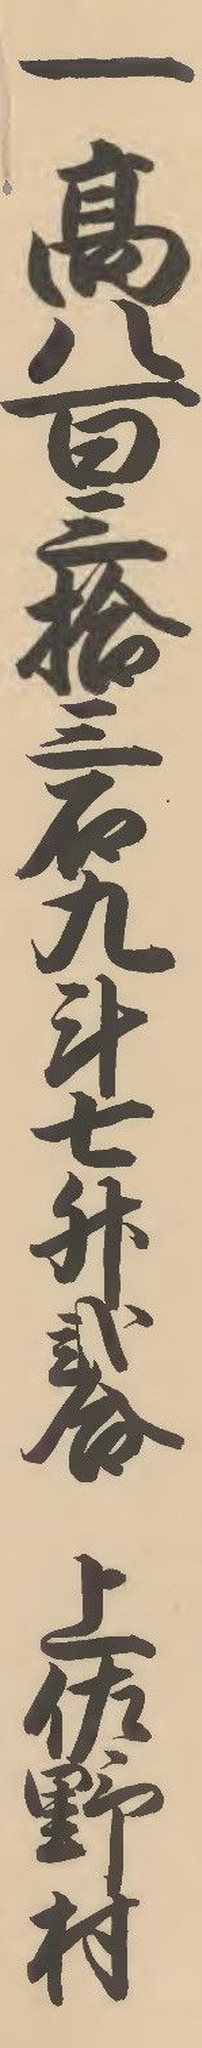一髙八百三拾三石九斗七升弐合上佐野村
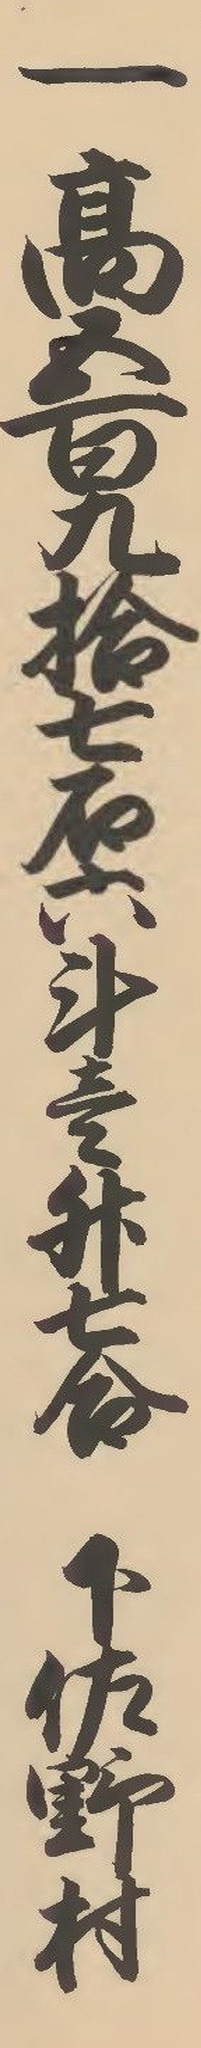一髙五百九拾七石六斗壱升七合下佐野村
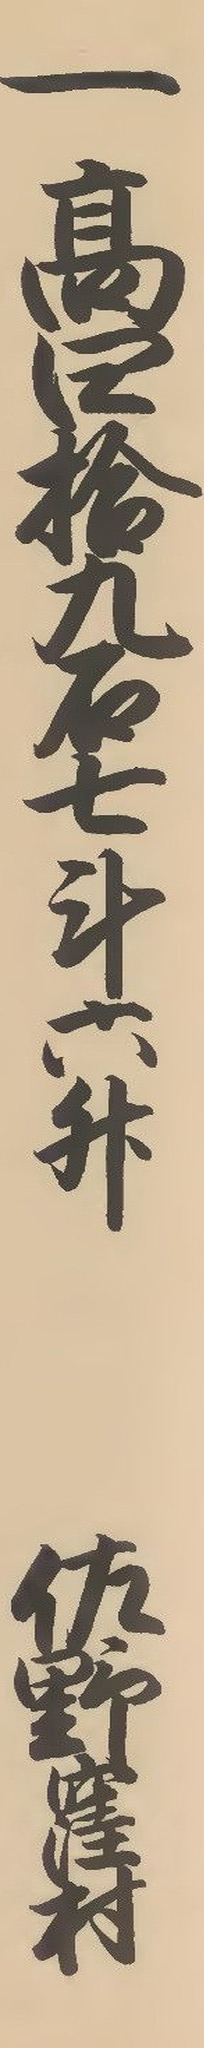一髙四拾九石七斗六升佐野窪村
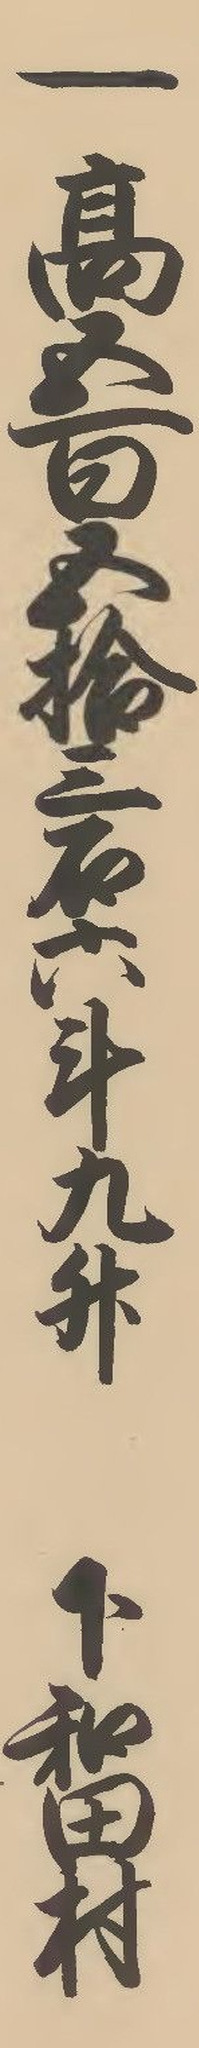一髙五百五拾三石六斗九升下和田村
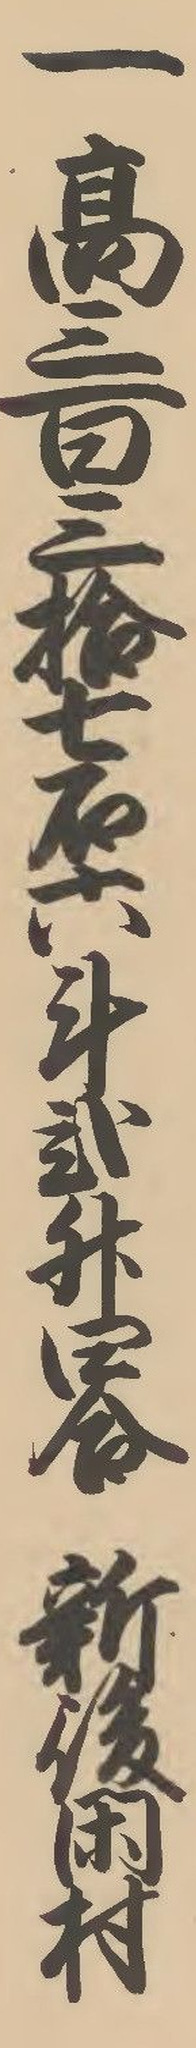一髙三百三拾七石六斗弐升四合新後閑村

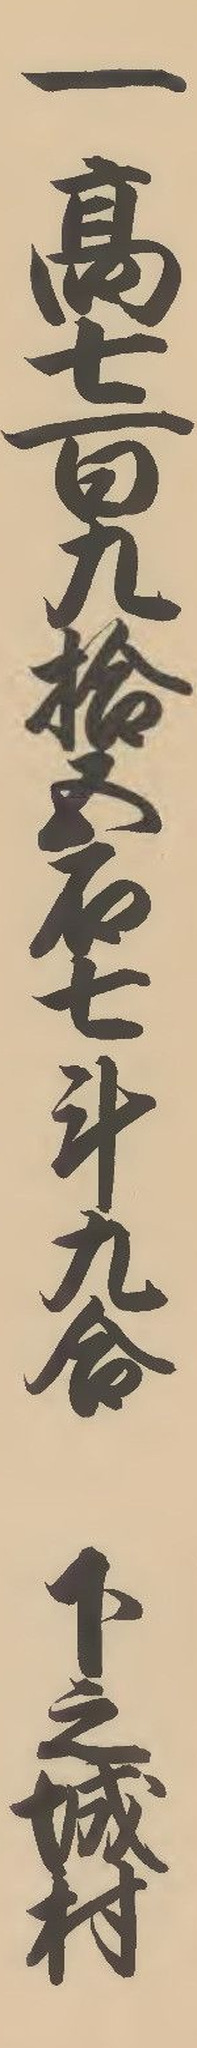一髙七百九拾五石七斗九合下之城村
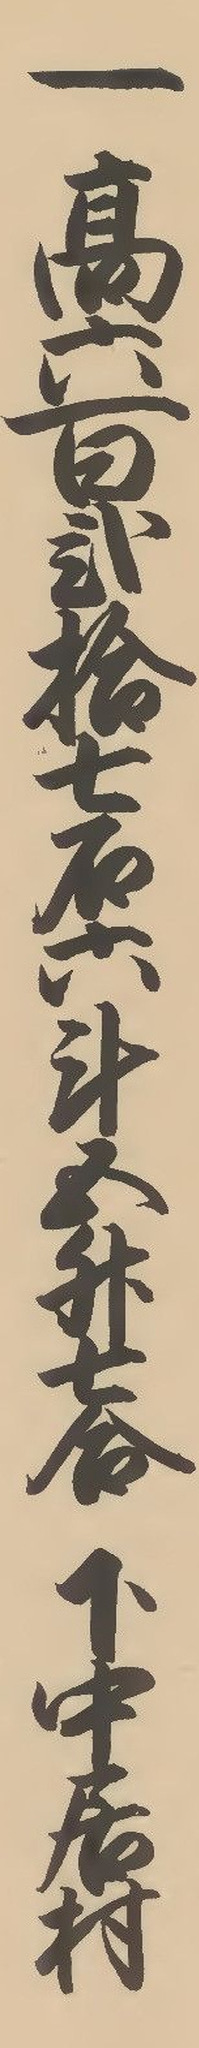一髙六百弐拾七石六斗五升七合下中居村
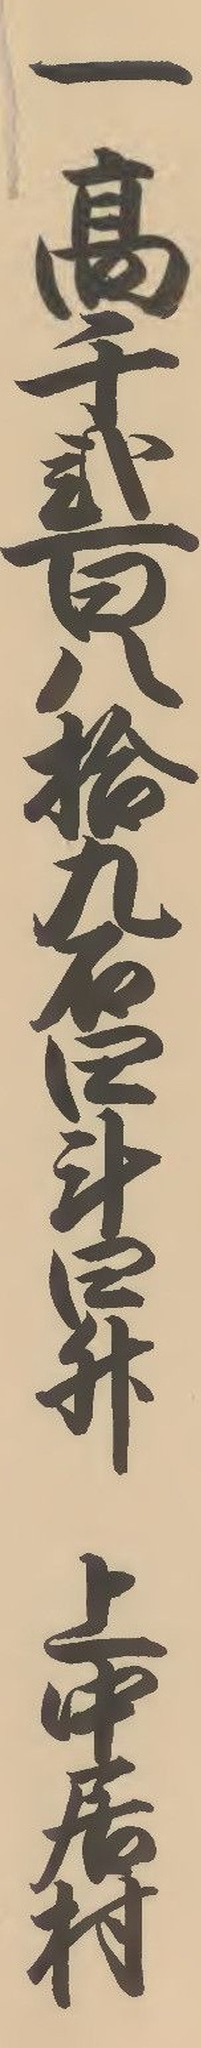一髙千弐百八拾九石四斗四升上中居村
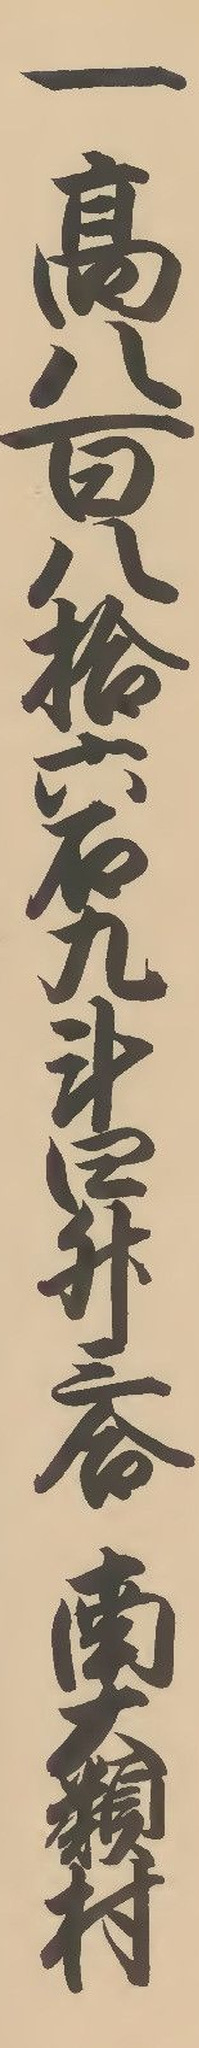一髙八百八拾六石九斗四升三合南大類村
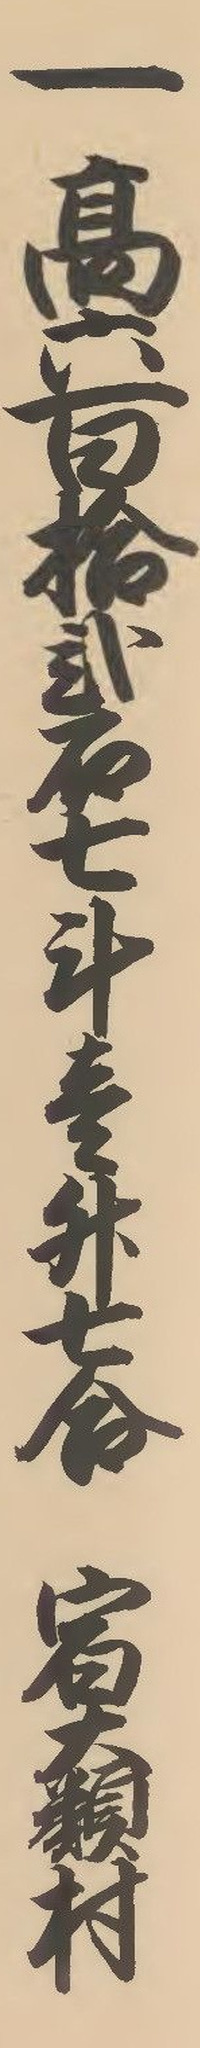一髙六百拾弐石七斗壱升七合宿大類村
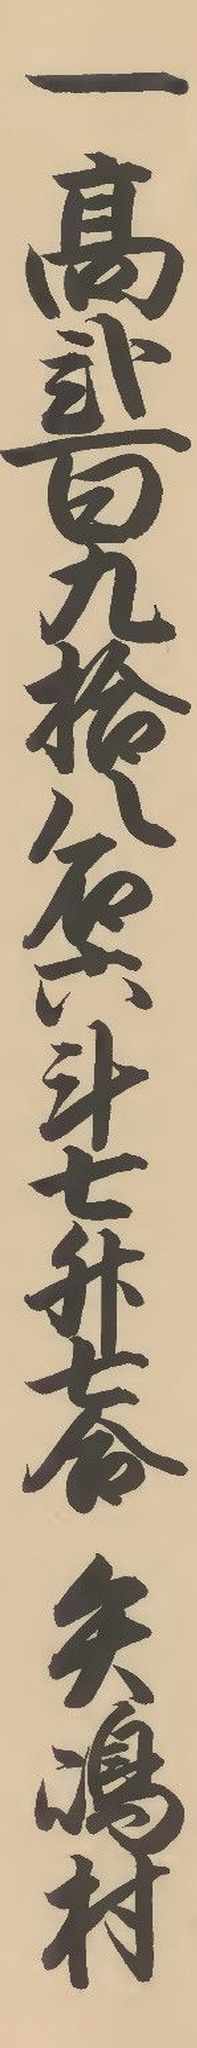一髙弐百九拾八石六斗七升七合矢嶋村
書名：上野国郷帳
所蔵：国立公文書館 National Archives of Japan
